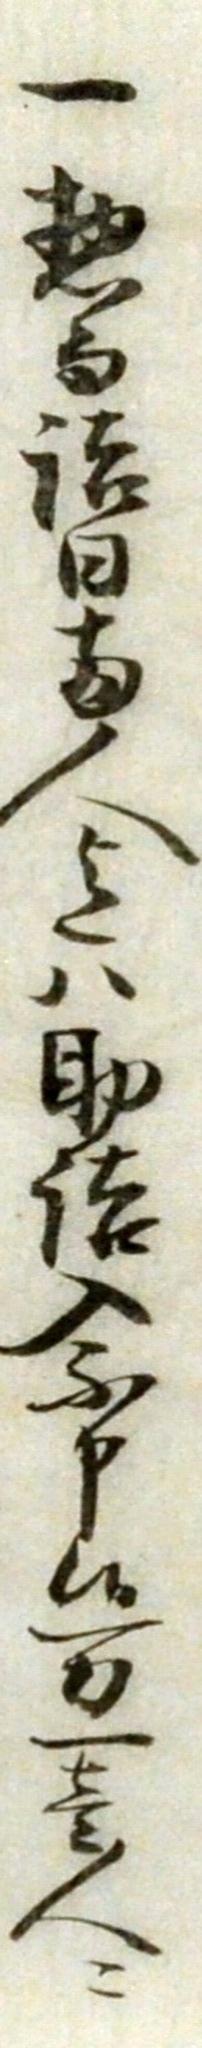一惣て詰日両人迄は助詰入不申候万一壱人に
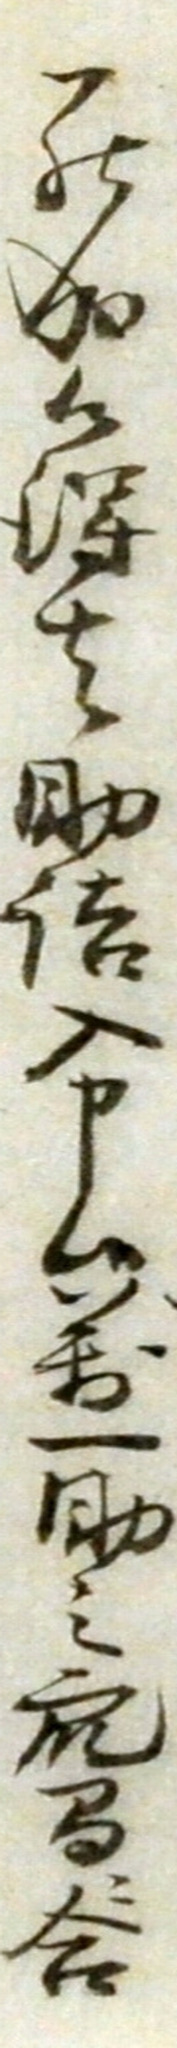罷成候得は助詰入申候萬一助之衆間に合
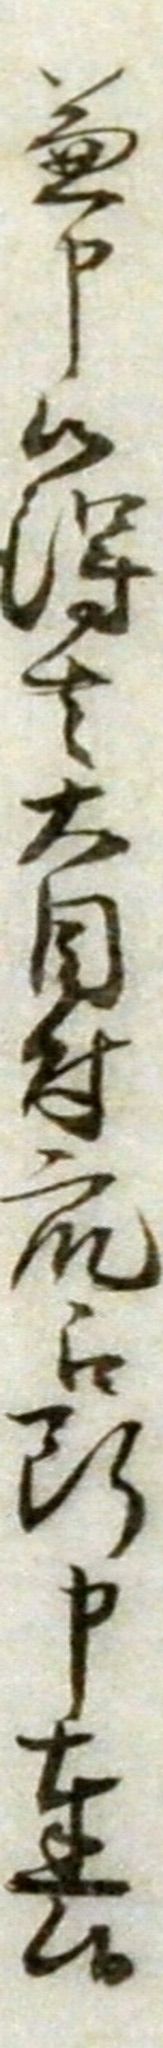兼申候得は大目付衆え断申達候

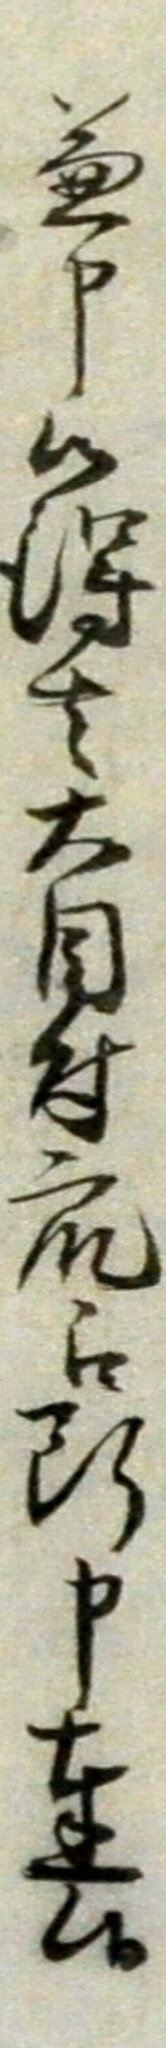多罷成候得は大目付え其段申達候
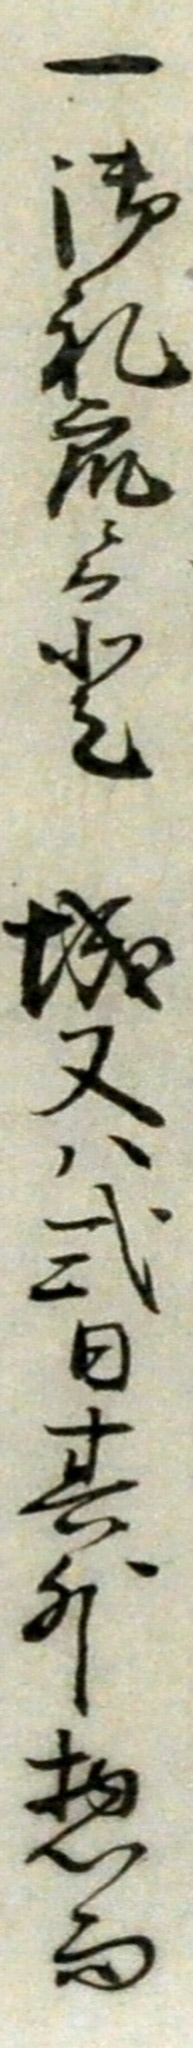一御礼衆にて登城又は式日其外惣て
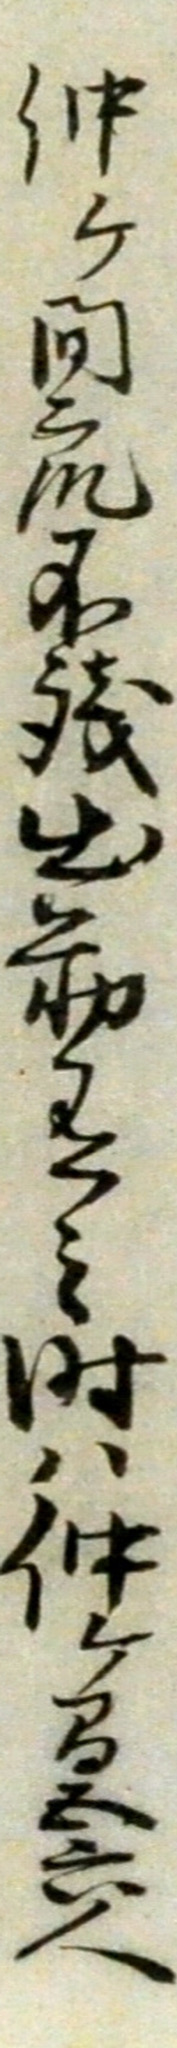仲ヶ間衆不残出勤有之時は仲ヶ間五六人
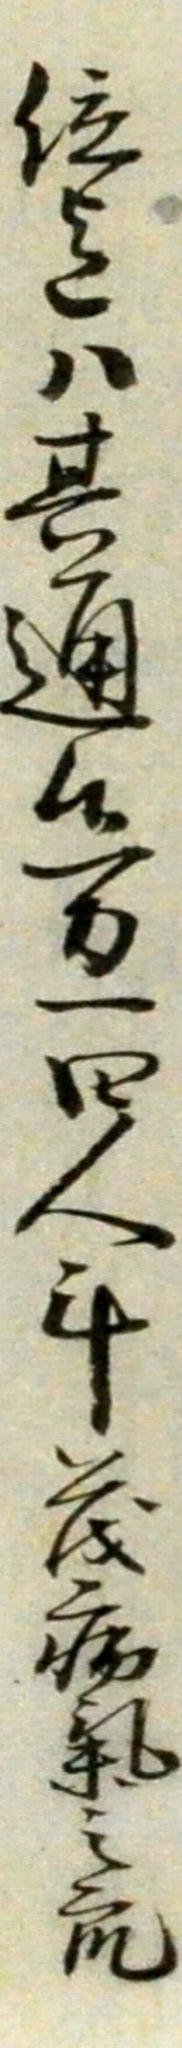位迄は其通候万一四人斗も病気之衆
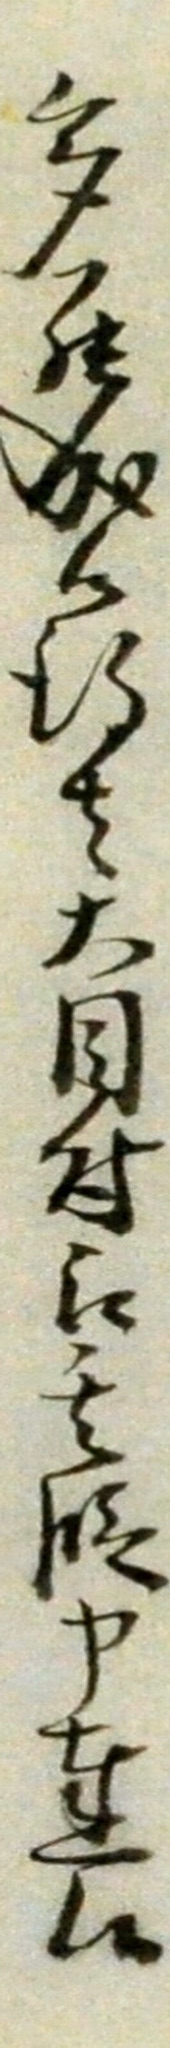多罷成候得は大目付え其段申達候
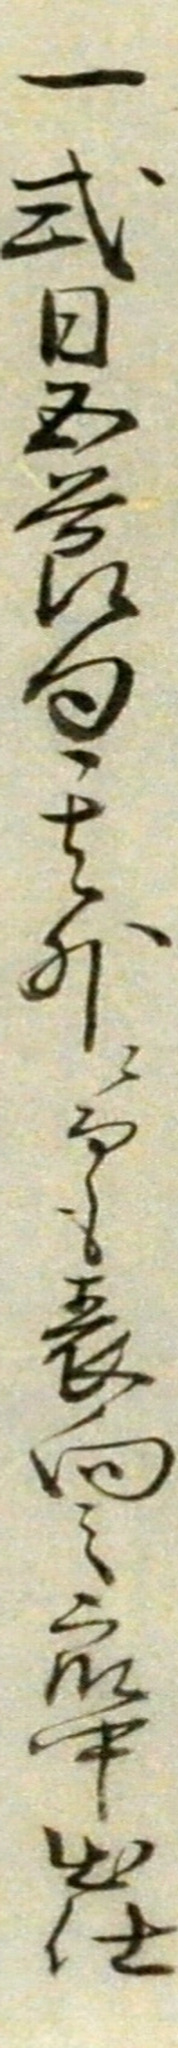一式日五節句其外にても表向之衆中出仕
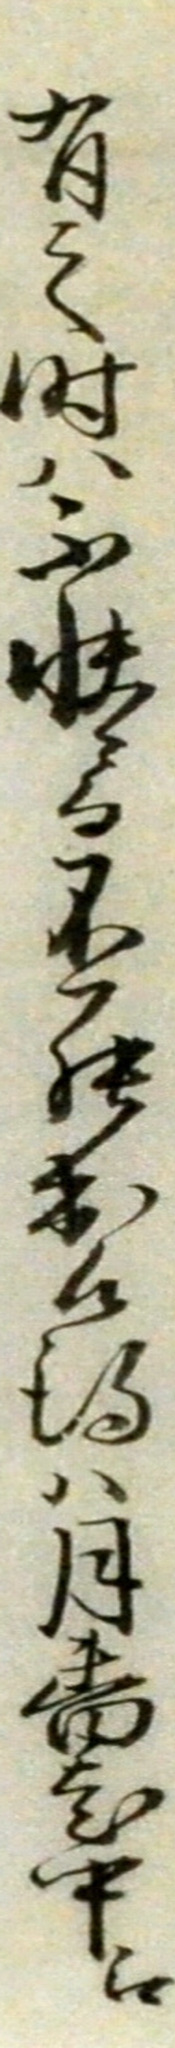有之時は不快にて不罷出候得は月番老中え
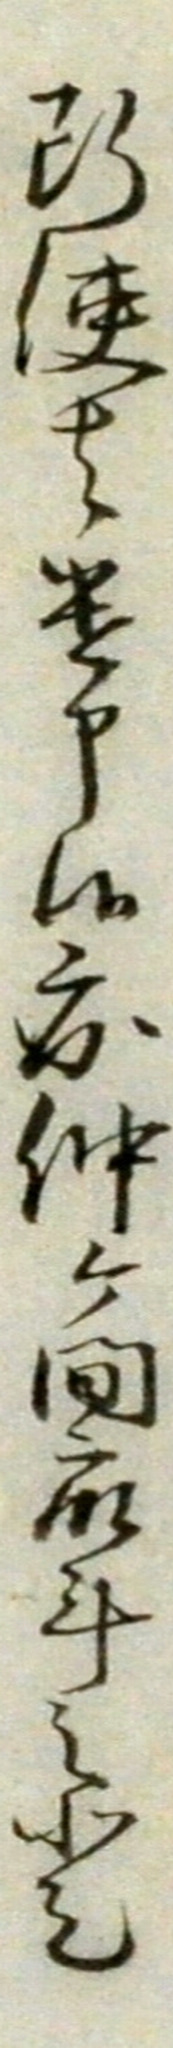断使者遣申候亦仲ヶ間衆斗之登
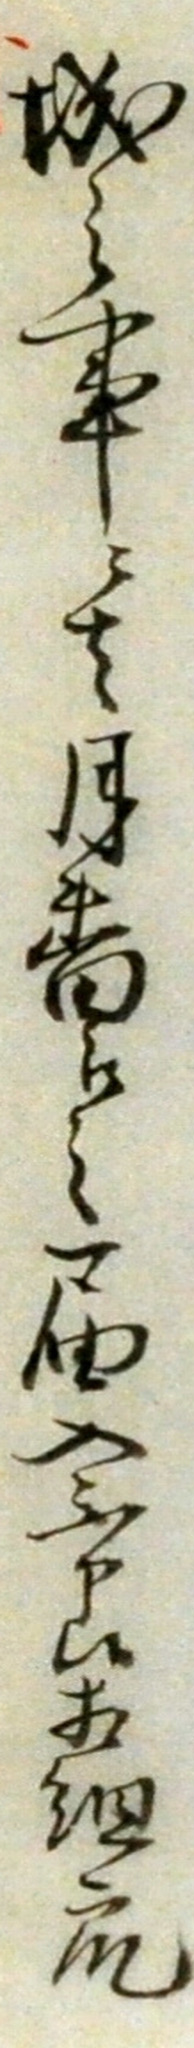城之事には月番え之届入不申候相組衆
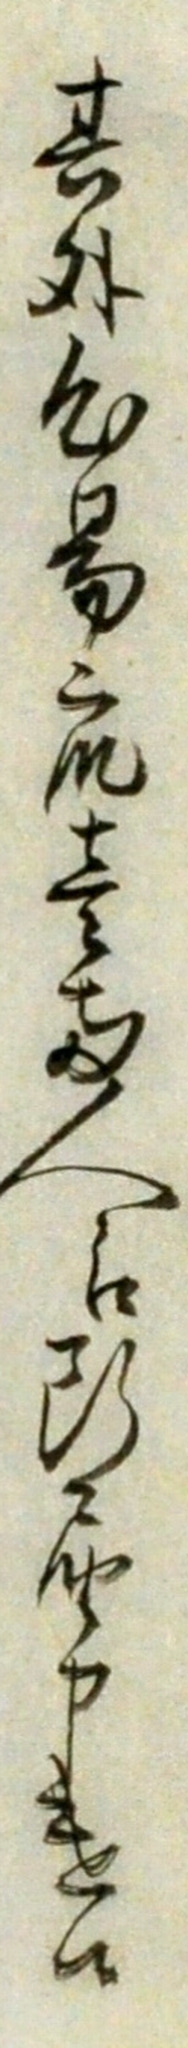其外心易衆壱両人え断届申遣候
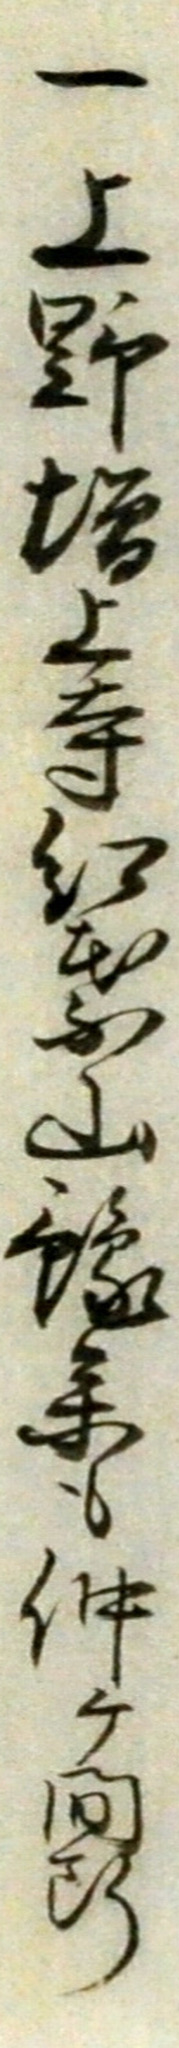一上の増上寺紅葉山予参も仲ヶ間断
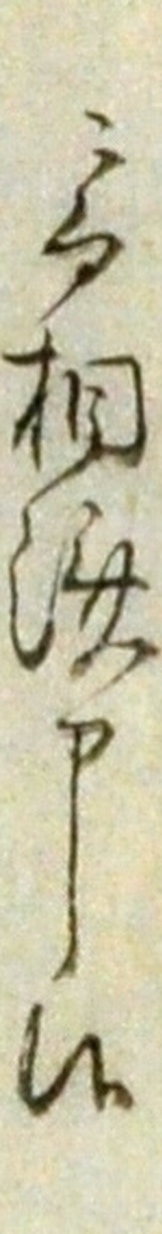にて相済申候
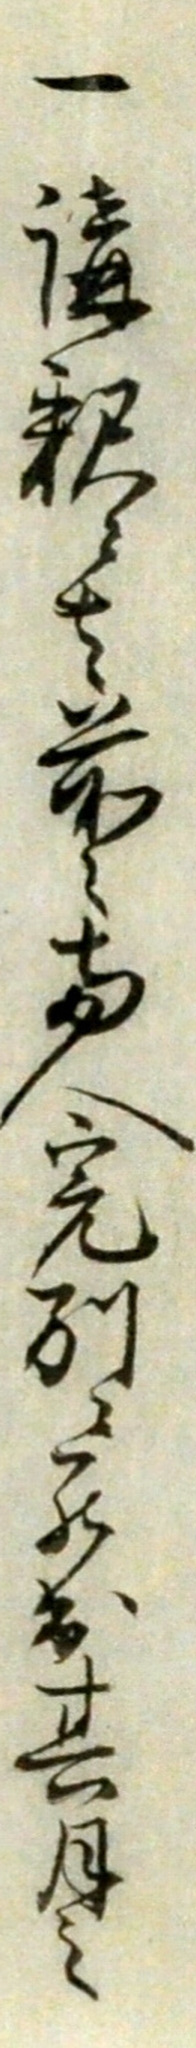一講釈には前々両人宛別々に罷出其月之
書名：申合帳〔一括〕
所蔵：伊那市立高遠町図書館・合同会社AMANE
